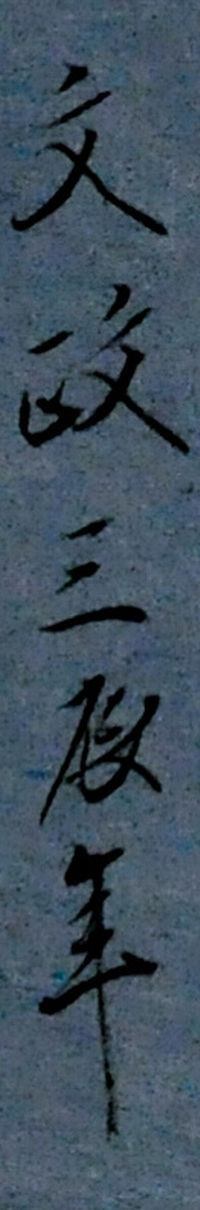文政三辰年
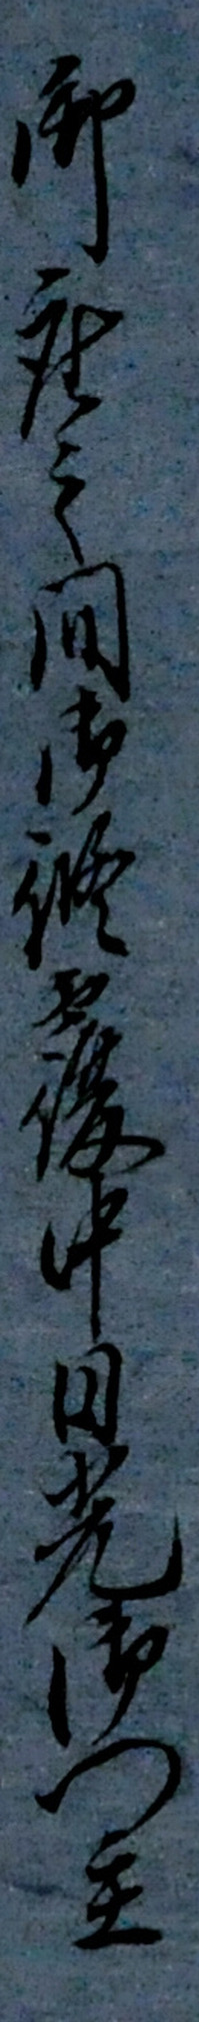御座之間御修覆中日光御門主
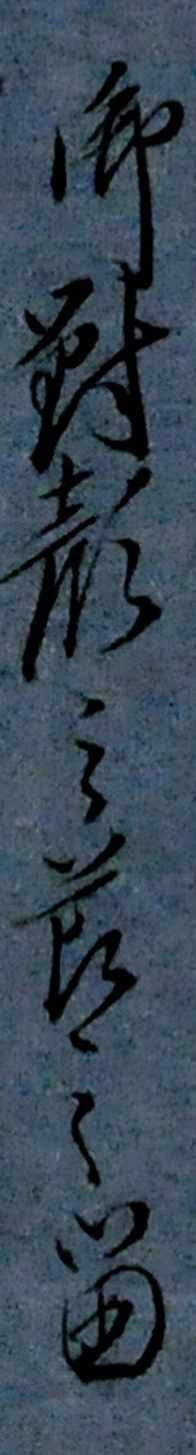御対顔之節之留
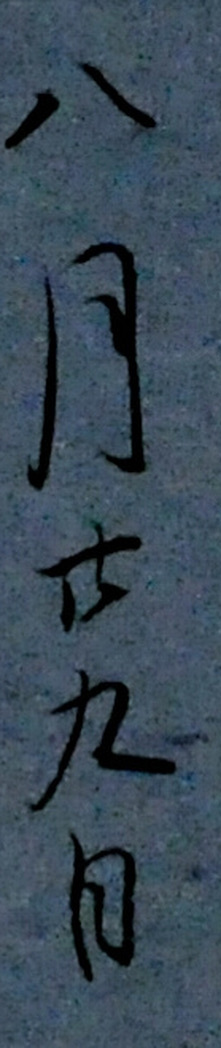八月廿九日
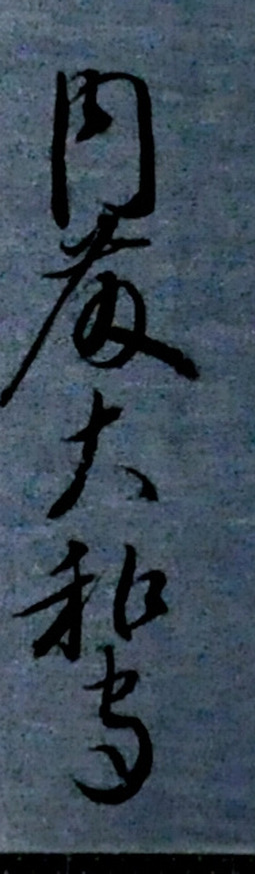内藤大和守

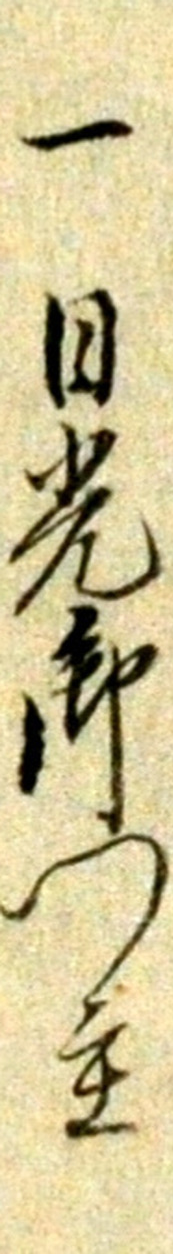一日光御門主
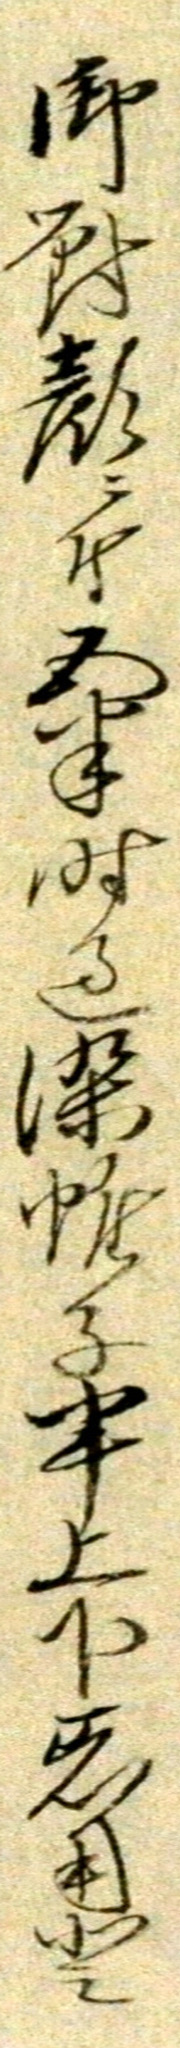御対顔ニ付五半時過染帷子半上下着用登
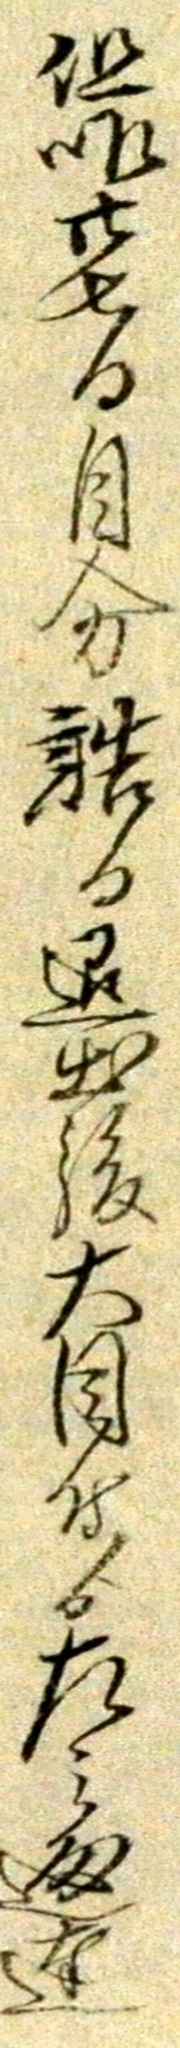但昨廿七日自分詰日退出後大目付ゟ左之通達
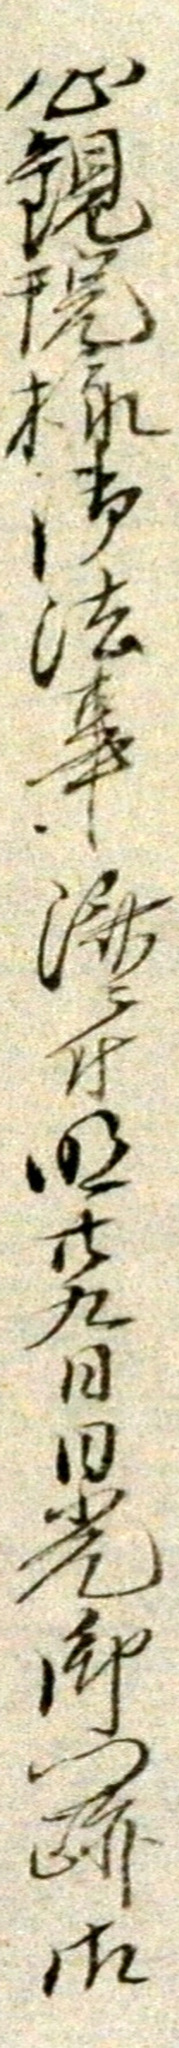心観院様御法事済ニ付明廿九日日光御門跡御
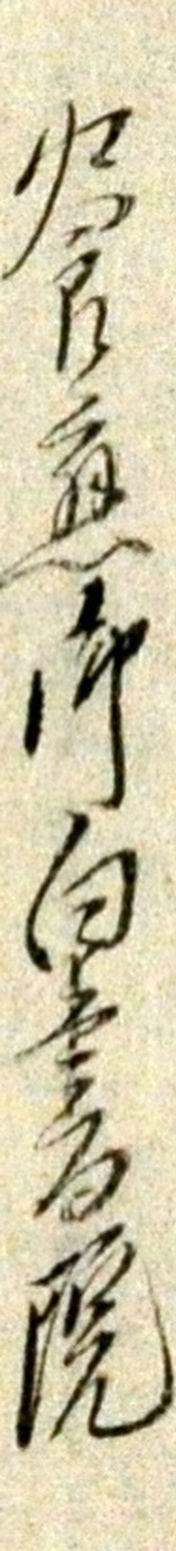饗応御白書院
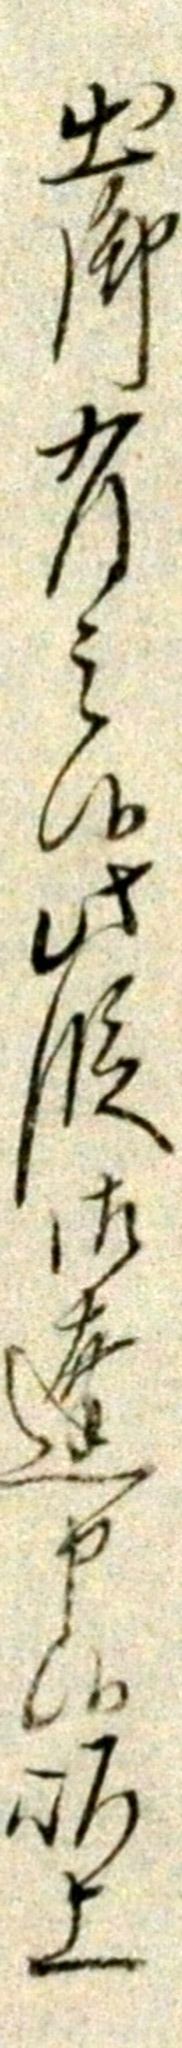出御有之候此段御達申候以上
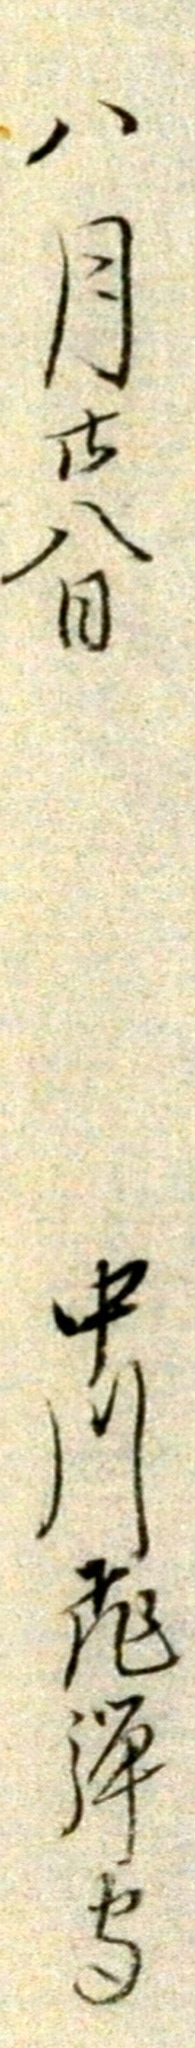八月廿八日中川飛騨守
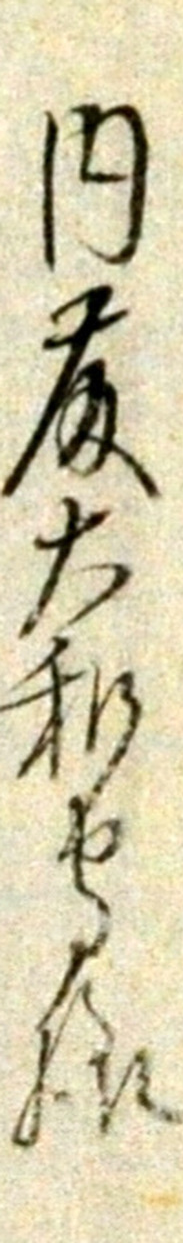内藤大和守様
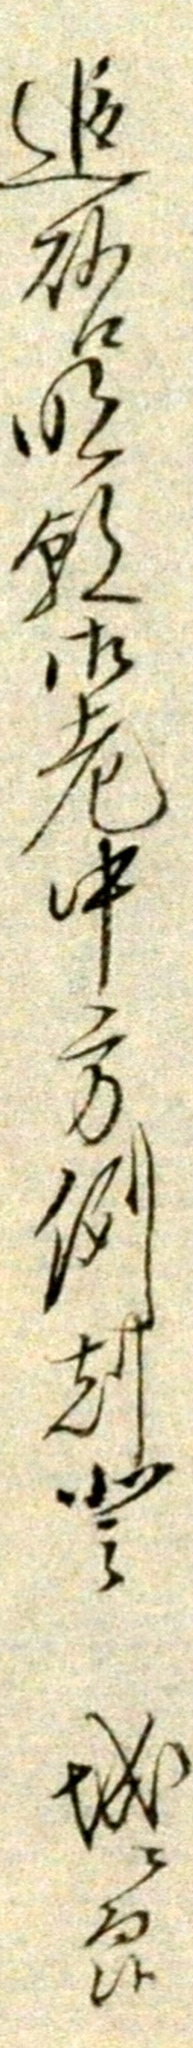追啓明朝御老中方例刻登城ニ而候
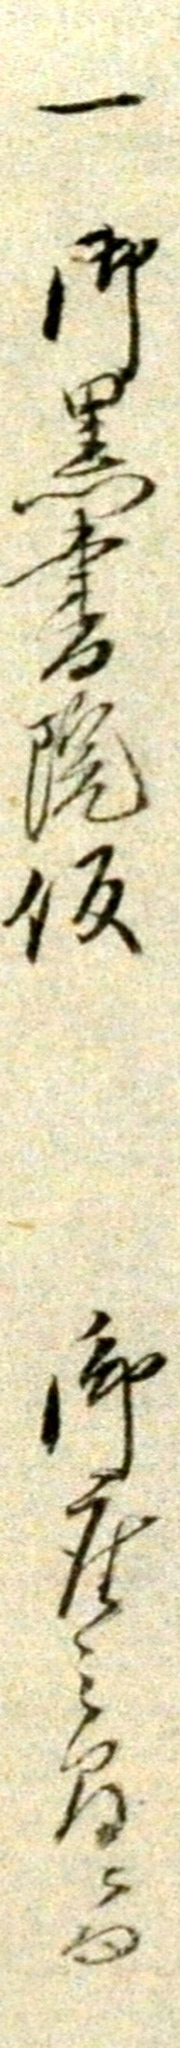一御黒書院仮御座之間ニ而
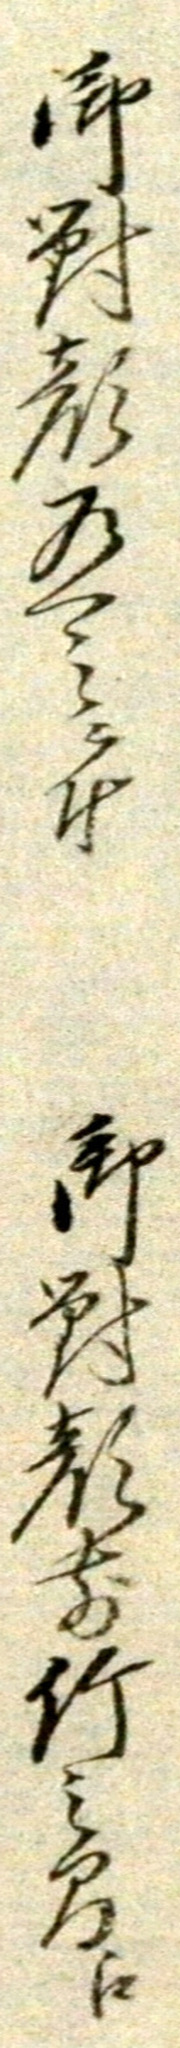御対顔有之ニ付御対顔前竹之間え
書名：御座ノ間御修覆中日光御門主御対顔ノ節ノ留
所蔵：伊那市立高遠町図書館・合同会社AMANE
